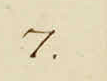7.
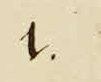1.
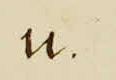11.
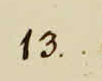13.
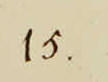15.
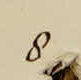8
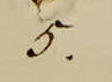5.
